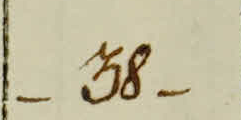- 38 -
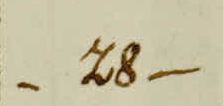- 28 -
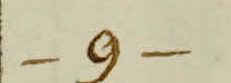- 9 -
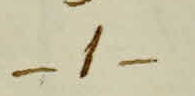- 1 -
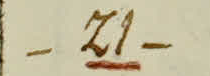- 21 -
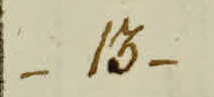- 13 -
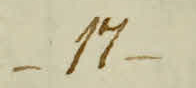- 17 -
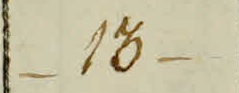- 13 -
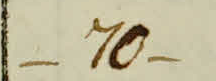- 70 -
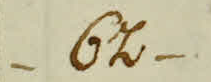- 62 -
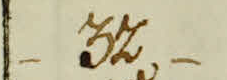- 32 -
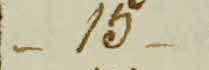- 15 -
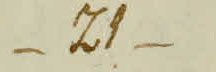- 21 -
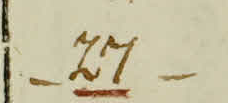- 27 -
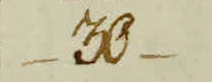- 30 -
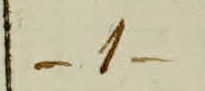- 1 -
